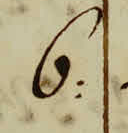6:
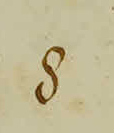8
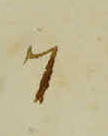7
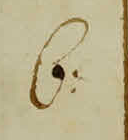6:
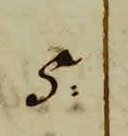5:
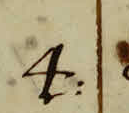4:
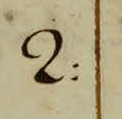2:
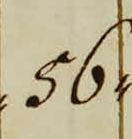56
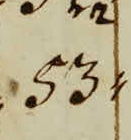53
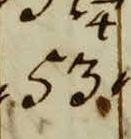53
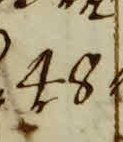48
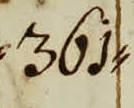361
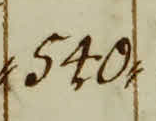540
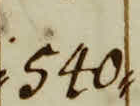540
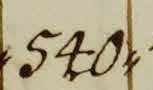540
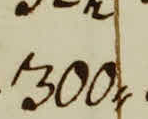300
